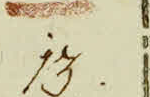13.
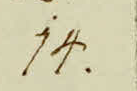14.
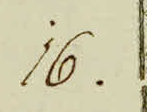16.
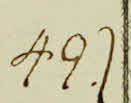49.
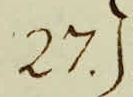27.
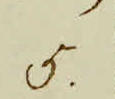5.
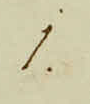1.
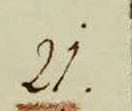21.
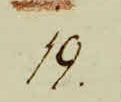19.
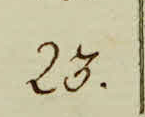23.
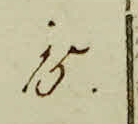15.
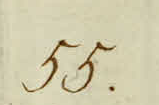55.
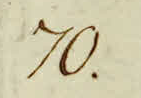70.
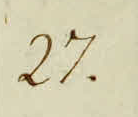27.
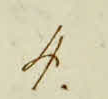4.
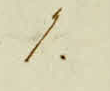1.
